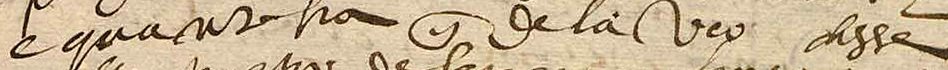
e quanto ha q̄ de la veo disse
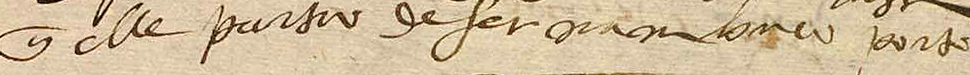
q̄ elle partio de pernambuco porto
